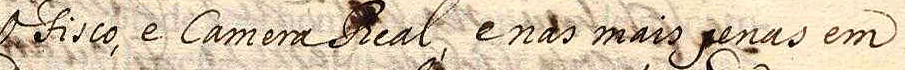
o Fisco, e Camera Real, e nas mais penas em
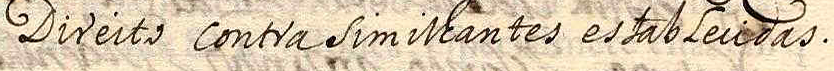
Direito contra similhantes establecidas.
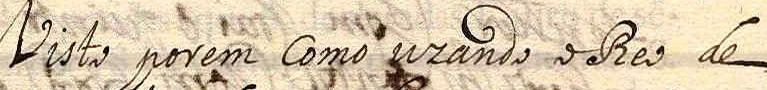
Visto porem como uzando o Reo de
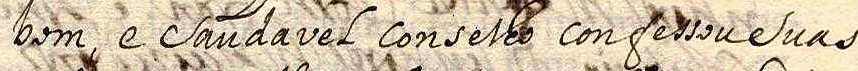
bom, e Saudavel conselho confessou Suas
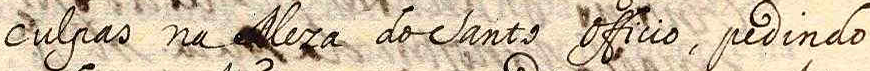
culpas na Meza do Santo officio, pedindo
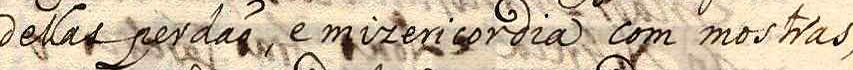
dellas perdaõ, e mizericordia com mostras,
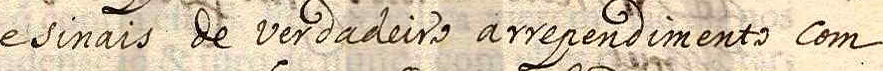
e sinais de verdadeiro arrependimento com
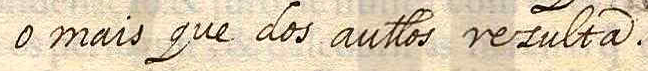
o mais que dos auttos rezulta.
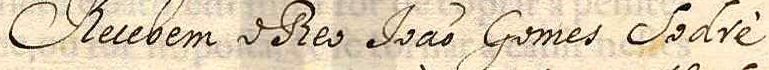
Recebem o Reo Ioaõ Gomez Sodré
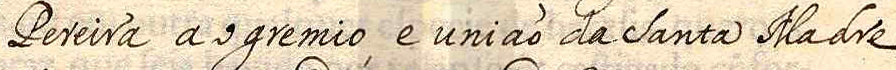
Pereira ao gremio, e união da Santa Madre
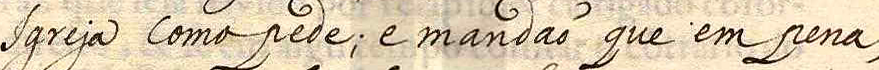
Igreja como pede; e mandaõ que em pena,
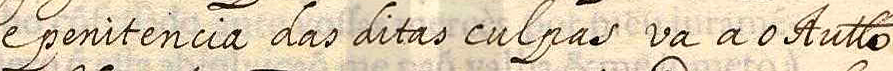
e penitencia das ditas culpas va ao Autto
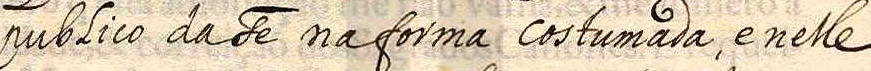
publico da Fe na forma costumada, e nelle
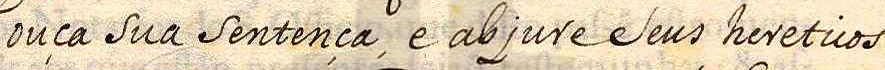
ouça sua sentença, e abjure seus hereticos
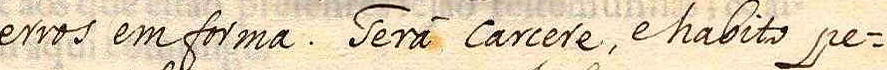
erros em forma. Terá carcere, e habito pe
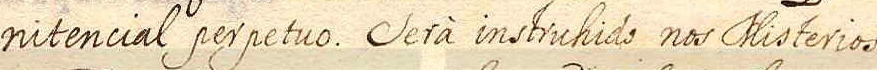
nitencial perpetuo. Será instruhido nos Misterios
